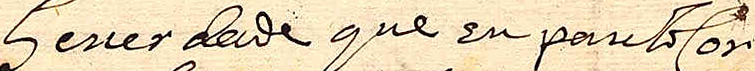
he uerdade que Eu paulo Cor
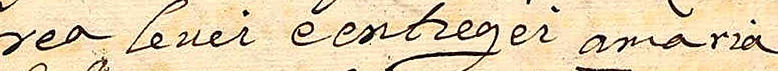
rea leuei e entregei a maria
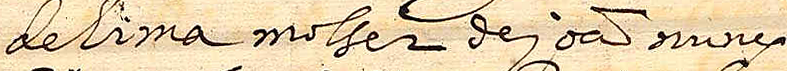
de lima molher de joaõ nunes
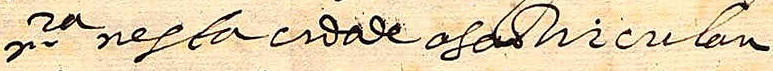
mra nesta cidade a saõ Niculau
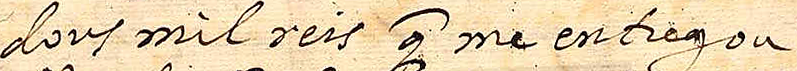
dous mil reis q̄ me entregou
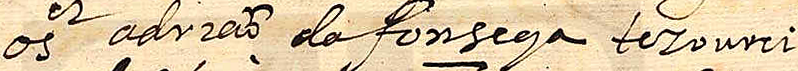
o sor adriaõ da fonseqa tezourei
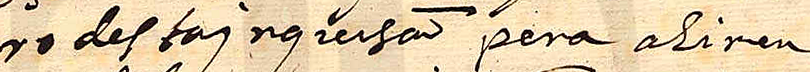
ro desta jnqicisaõ pera alimen
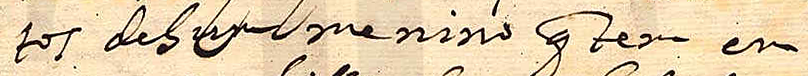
tos de hum menino q̄ tem em
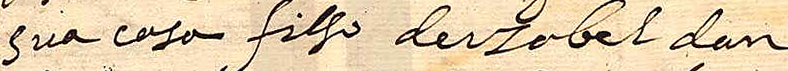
sua casa filho de izabel dan
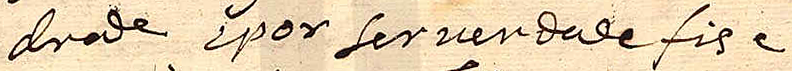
drade E por ser uerdade fis e
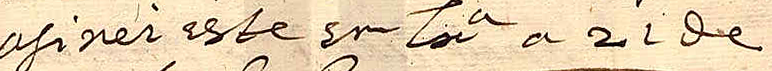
asinei Este Em lxa a 21 de
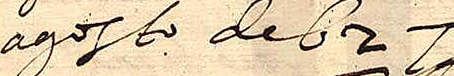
agosto de 627
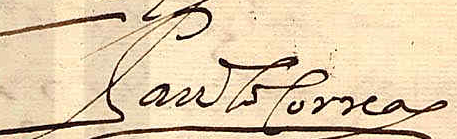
Paulo Correa
